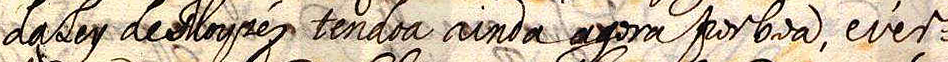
da Ley de Moyzés tendoa ainda agora por boa, e ver
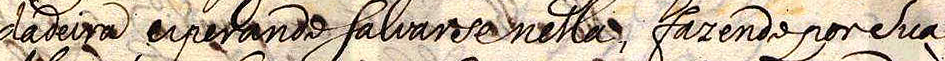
dadeira esperando salvarse nella, fazendo por sua
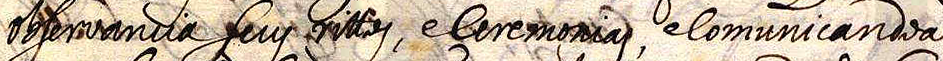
observancia seus rittos, e Ceremonias, e Comunicandoa
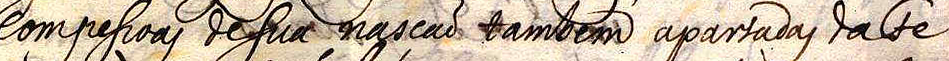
com pessoas de sua nasçaõ tambem apartadas da Fe
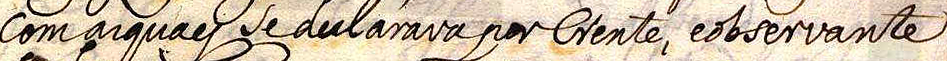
com as quaes se declarava por Crente, e observante
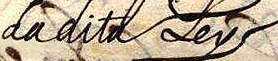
da dita Ley
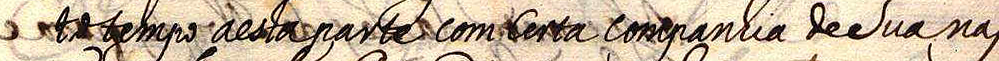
to tempo a esta parte com certa companhia de sua nas
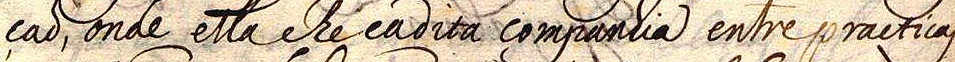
çaõ, onde ella Re e a dita companhia entre practicas
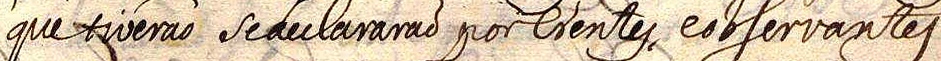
que tiveraõ se declararaõ por crentes, e observantes
